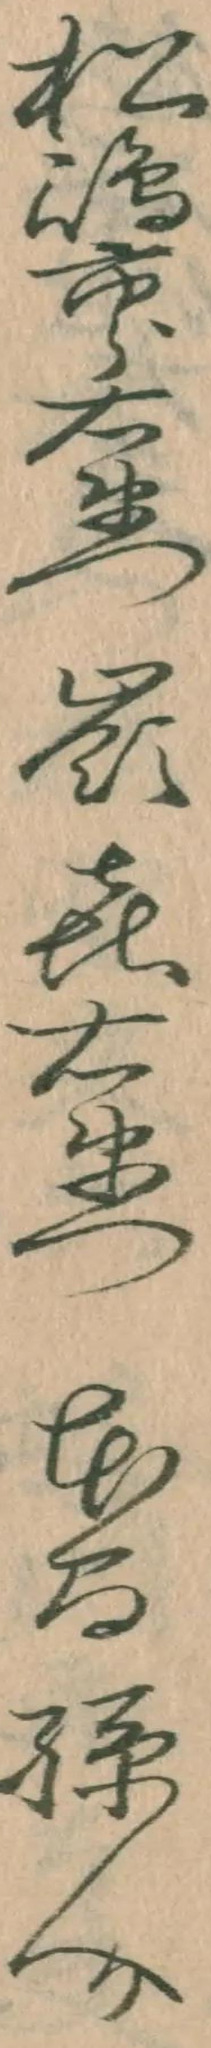松島市郎右衛門嶺喜右衛門本間孫介
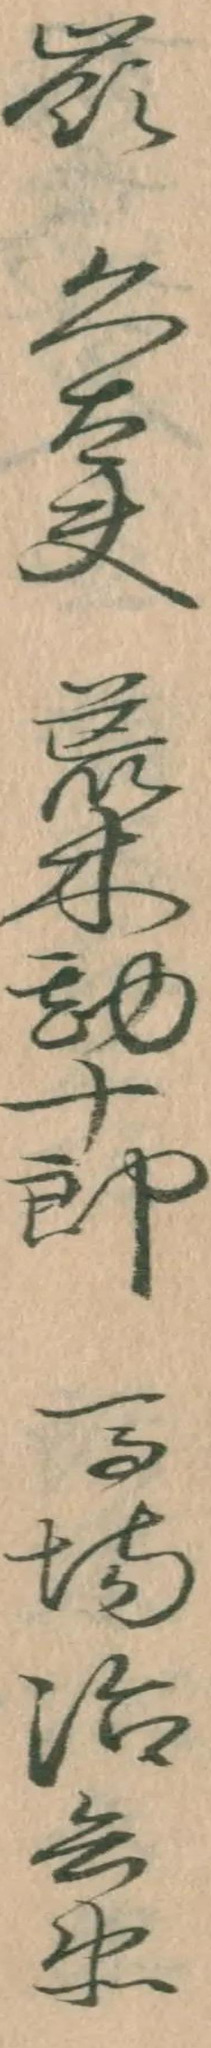奥又太夫荒木勘十郎馬場治兵衛
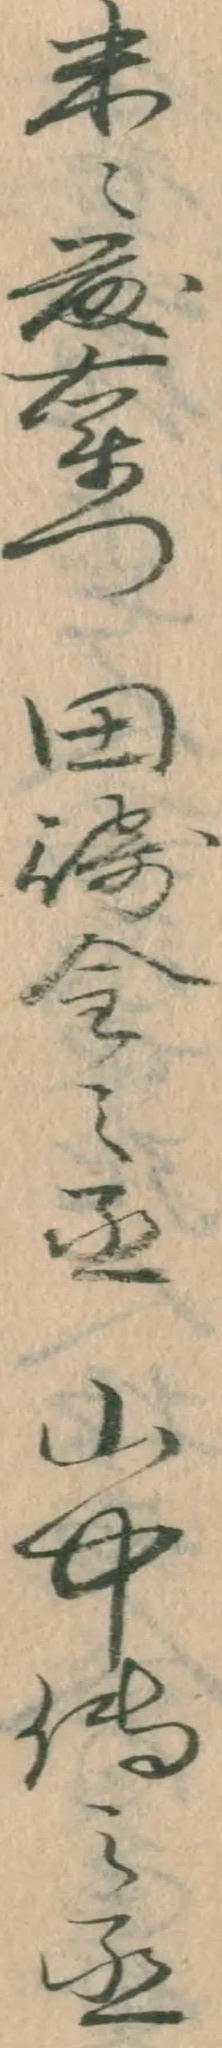米々藤右衛門田崎金之丞山中伝之丞
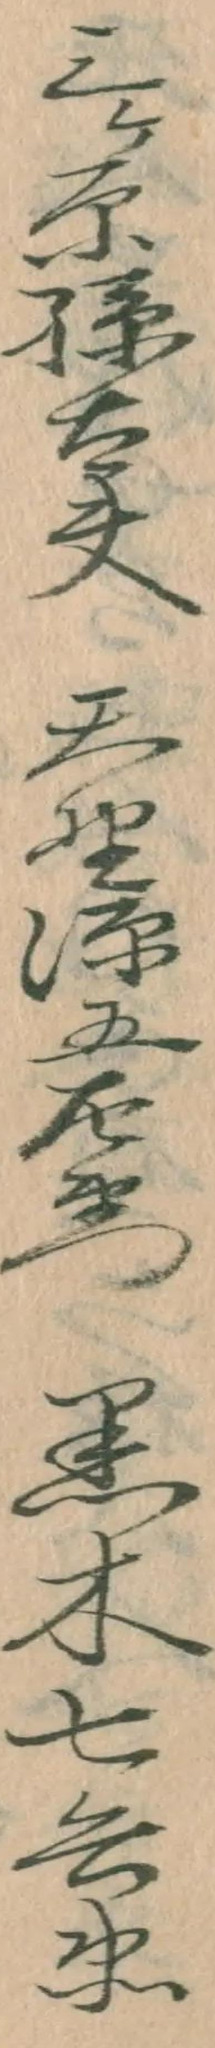三け原孫太夫天野源五左衛門黒木七兵衛
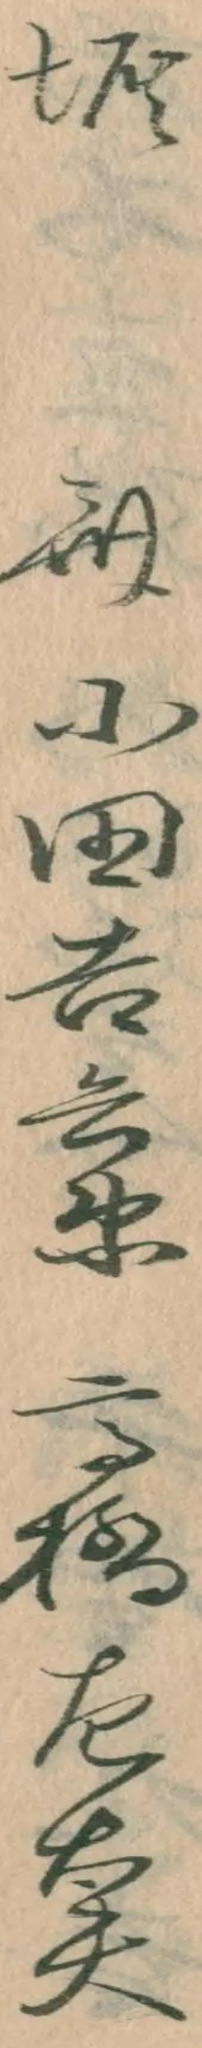堀斎小田吉兵衛高橋左太夫
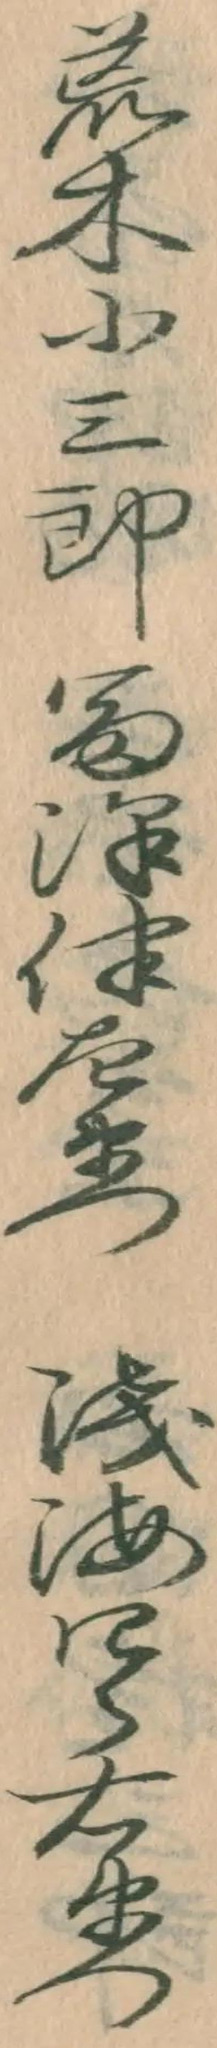荒木小三郎冨沢伴左衛門浅海四郎右衛門

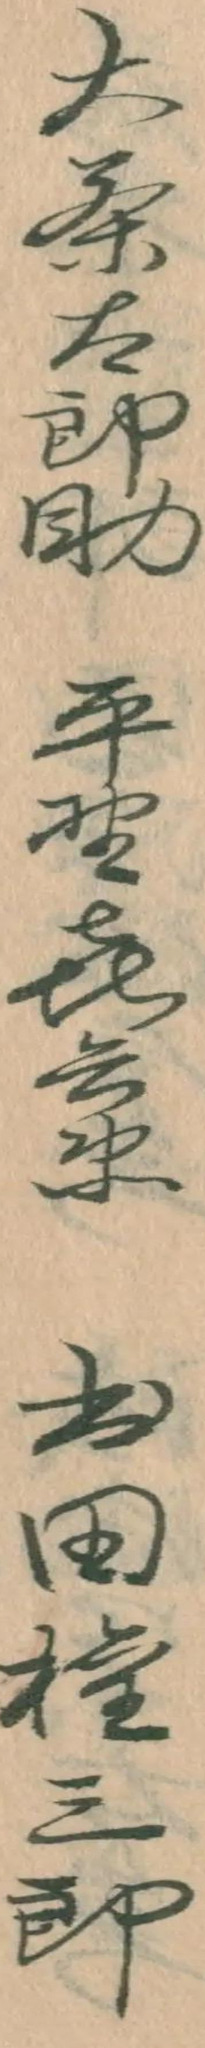大茶太郎助平賀喜兵衛出田権三郎
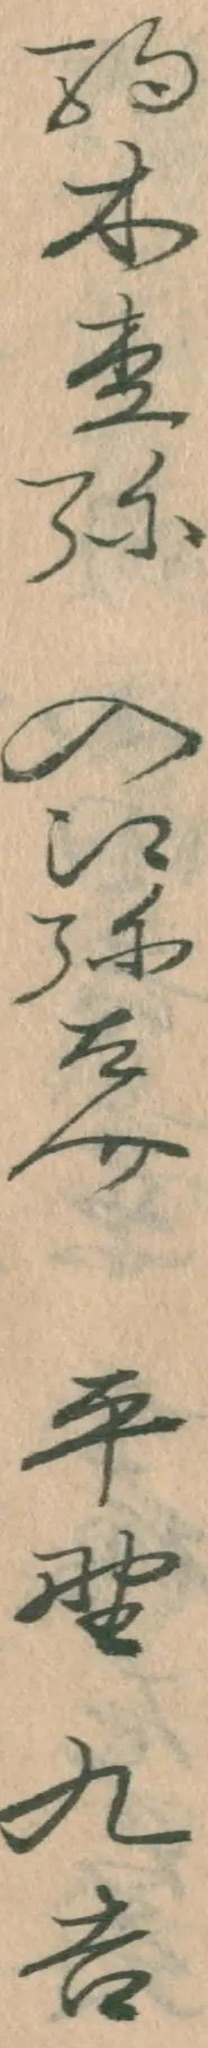駒木杢弥入江弥太助平賀九吉
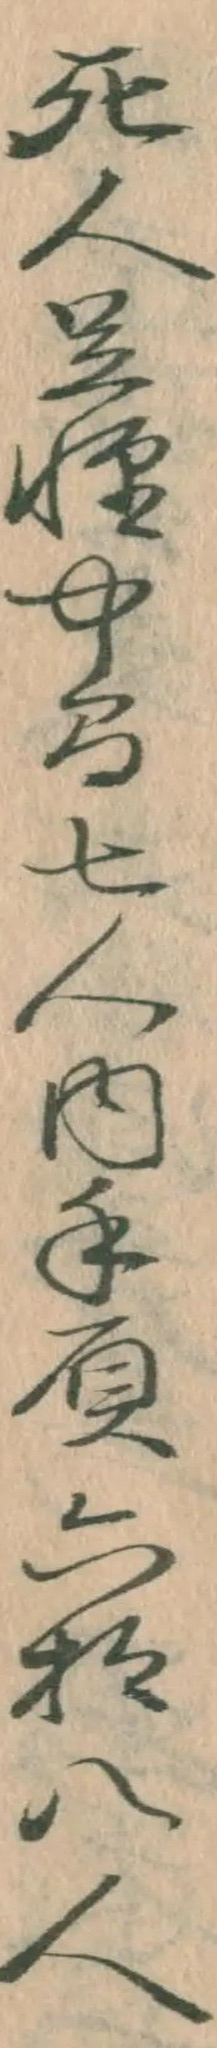死人足軽中間七人内手負六拾八人
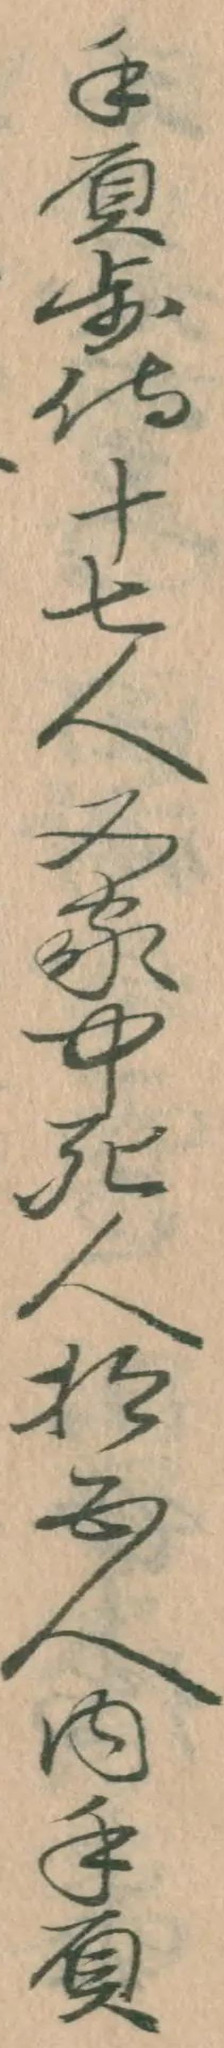手負歩侍十七人又家中死人拾五人内手負
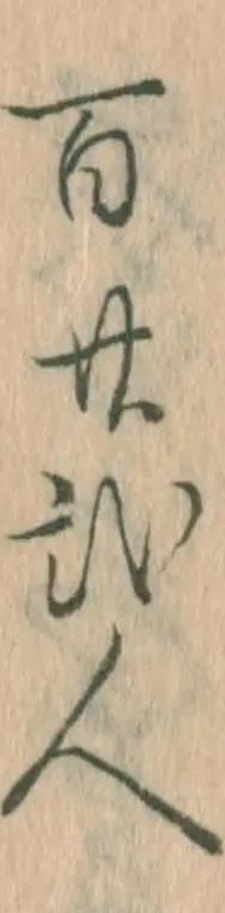百廿弐人
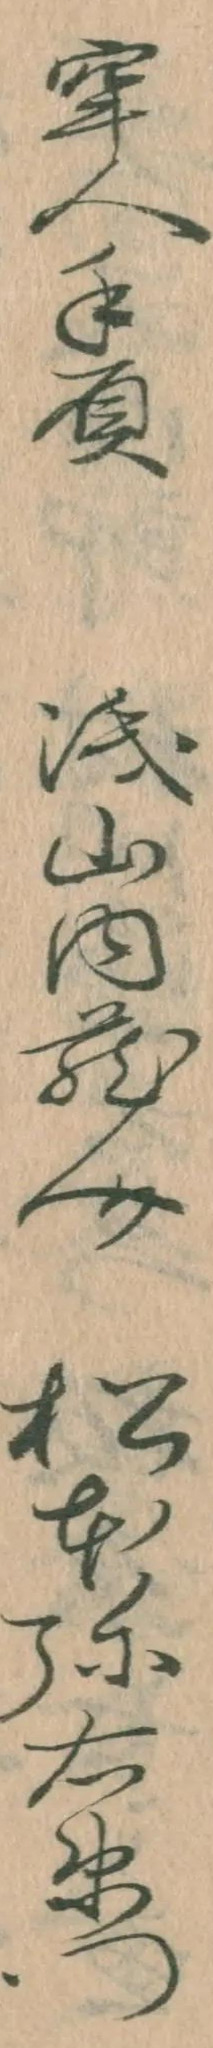牢人手負浅山内蔵介松本弥右衛門
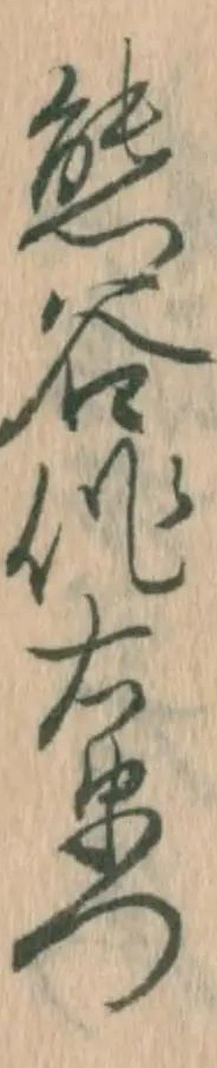熊谷作右衛門
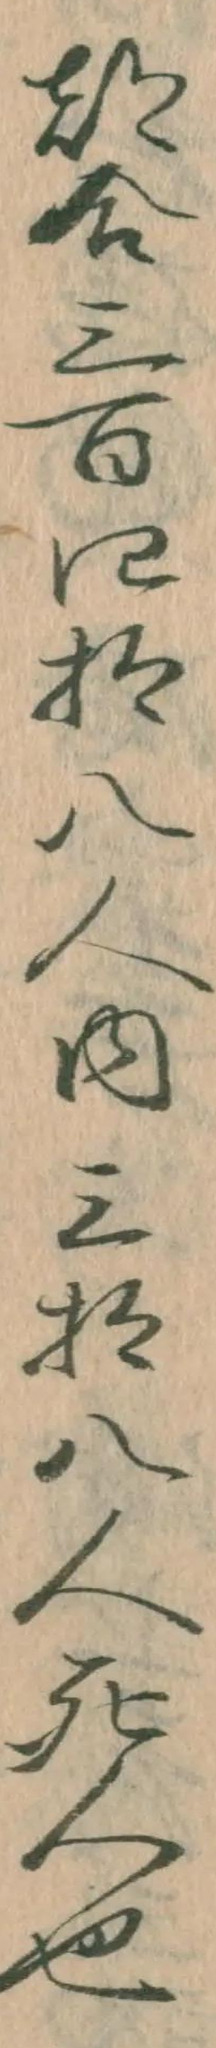都合三百四拾八人内三拾八人死人也
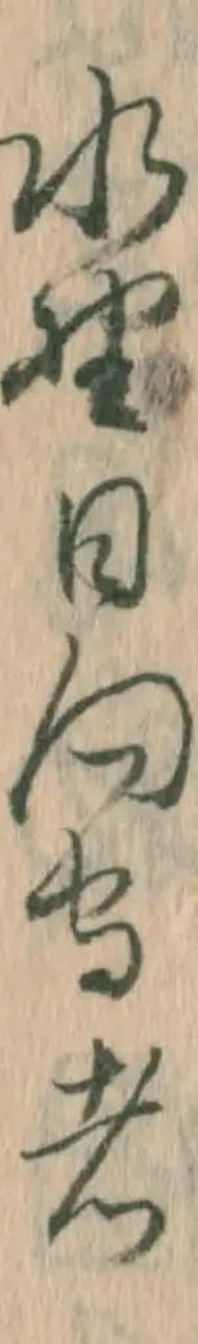水野日向守者
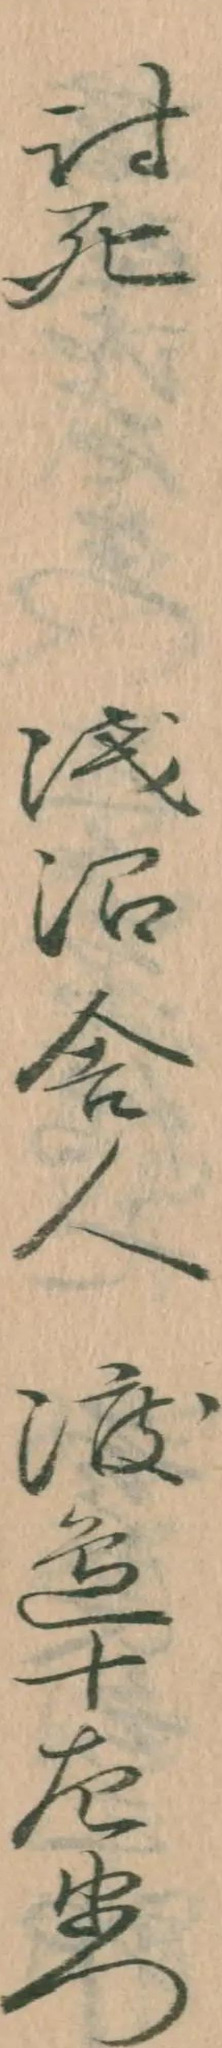討死浅沼舎人渡辺十左衛門
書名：切支丹御退治記 49巻. [9]
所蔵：国立国会図書館 National Diet Library, JAPAN
